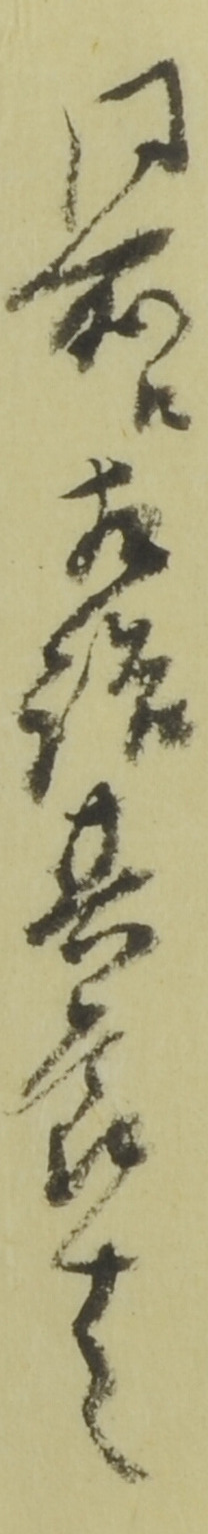同所江相詰其節は
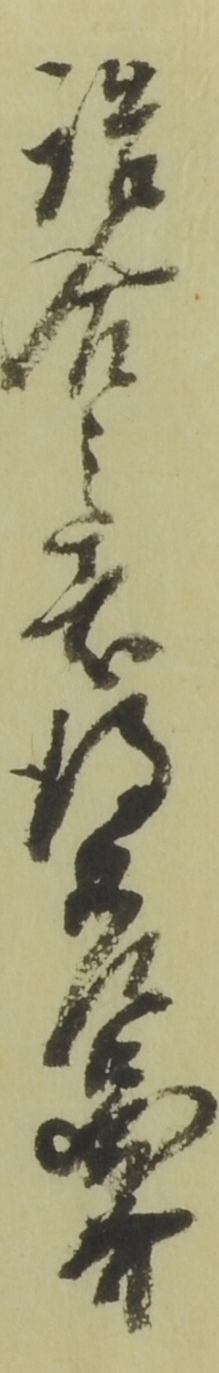詰合之者候得差図可
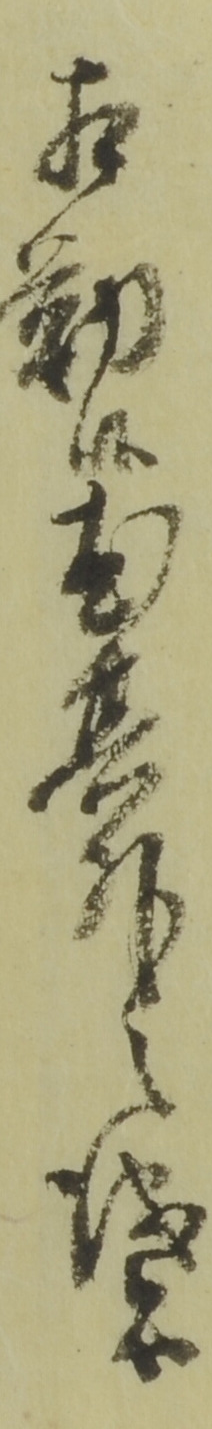相勤候尤其外之儀は
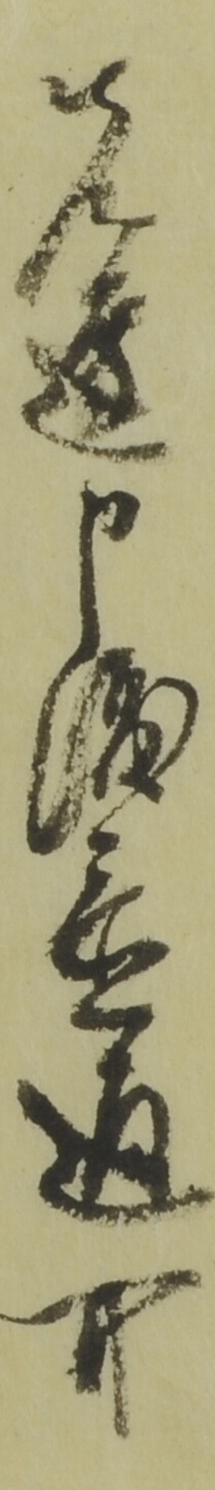先達申渡置通可
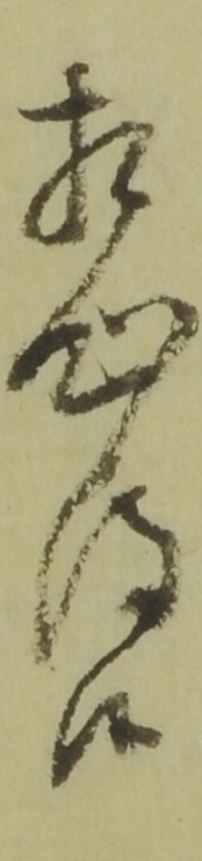相心得候
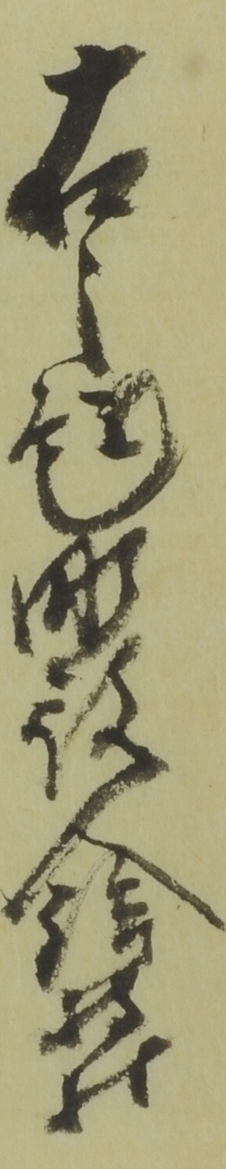右之趣町役人鉾持村
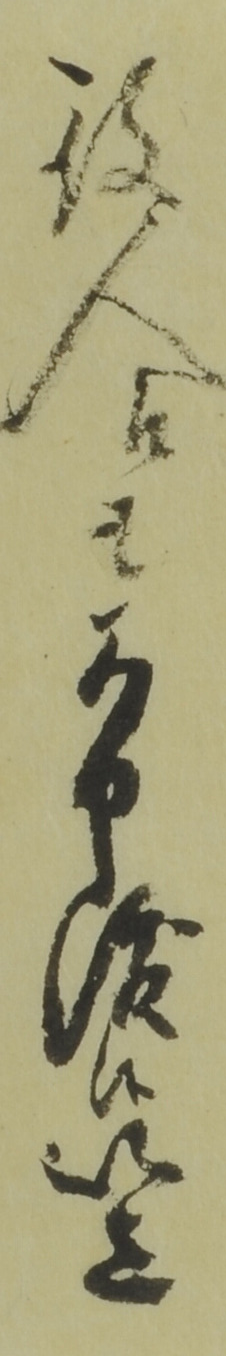役人江も可申渡候以上
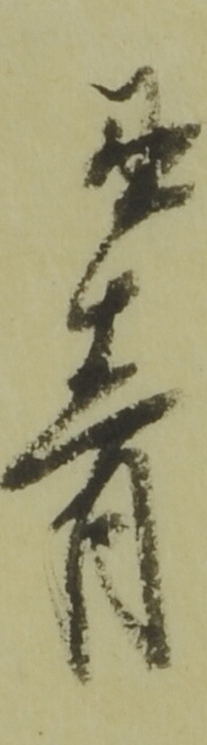丑十二月
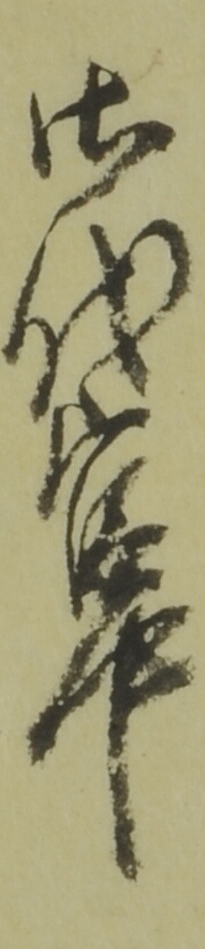御代官中
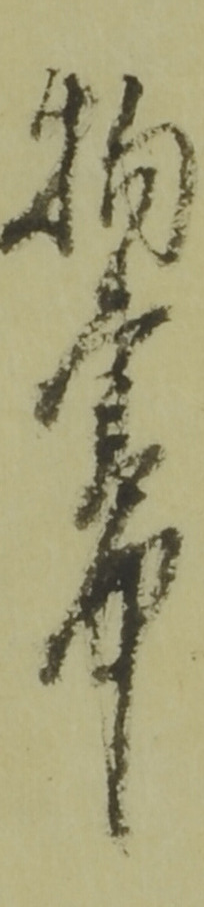物書中

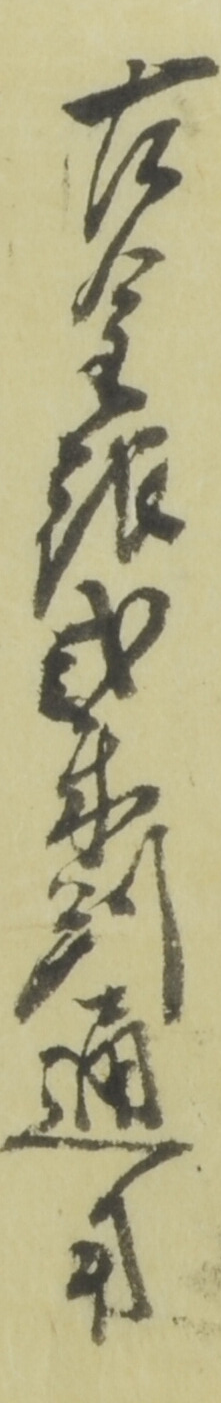古金銀弐朱判通用
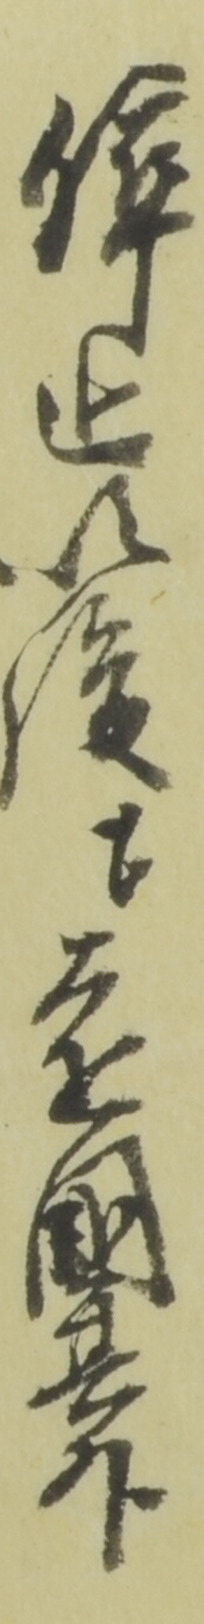停止以後も遠国其外
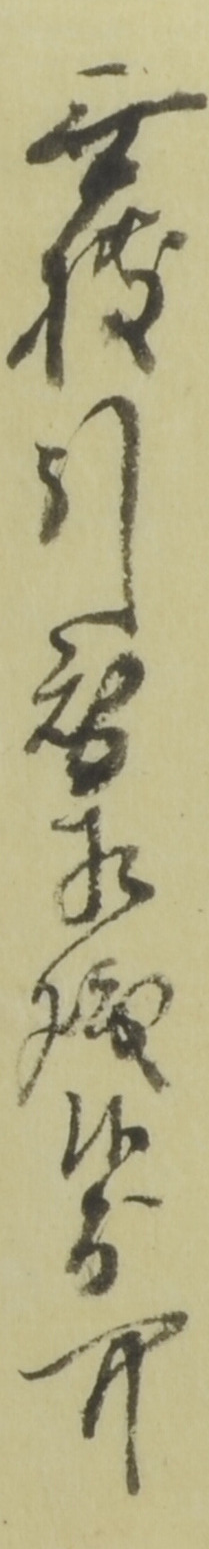無拠引替相残候旨可
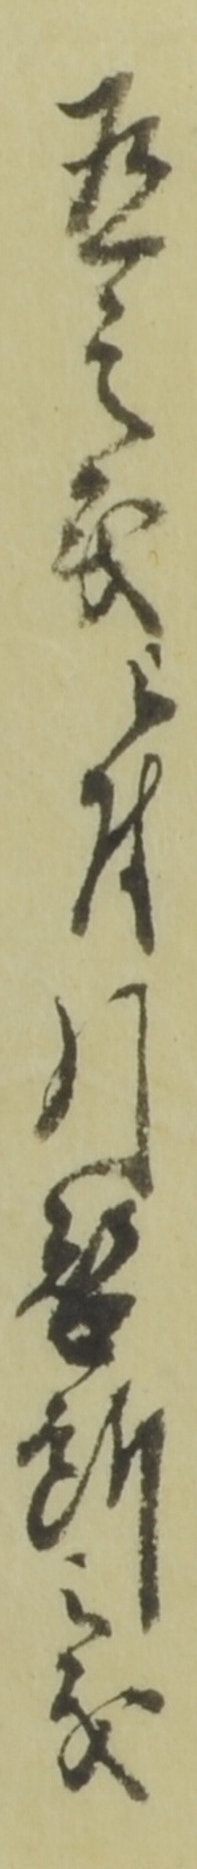有之義ニ付引替所之義
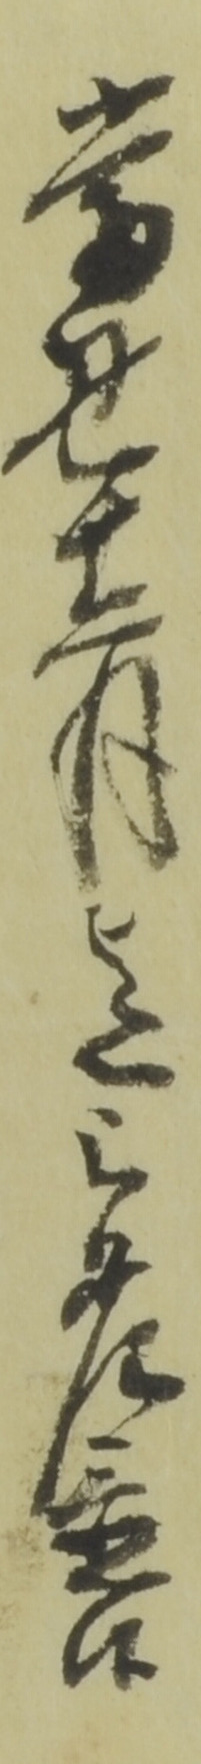当丑十二月迄被差置候
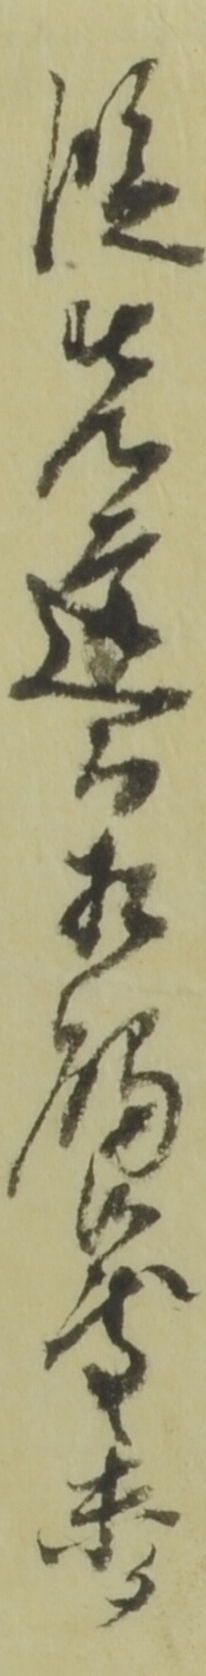段先達而相触候処未タ
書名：御触書御書附控
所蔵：伊那市立高遠町図書館・合同会社AMANE
